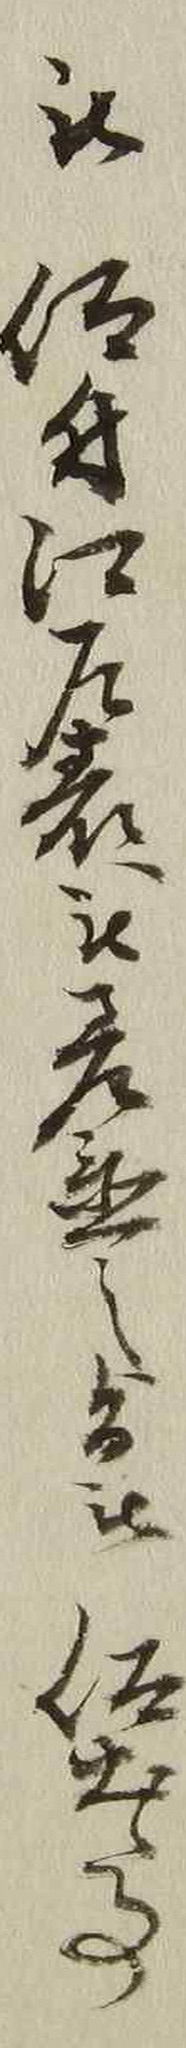被仰付江戸表へ被差置之旨被仰出候事
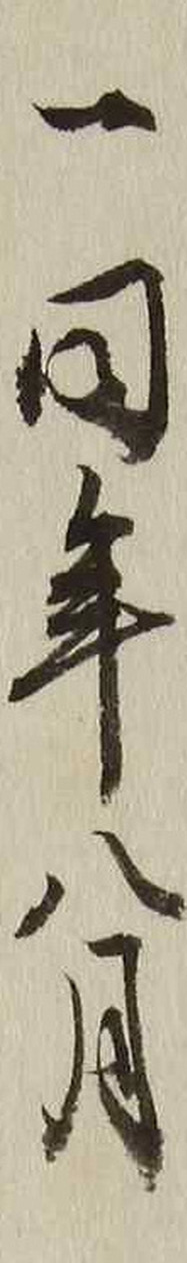一同年八月
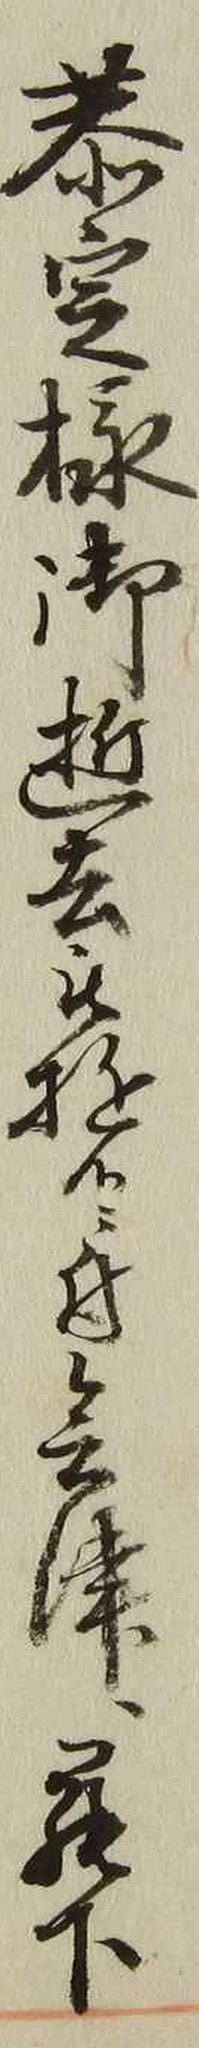恭定様御逝去被遊候ニ付会津へ罷下
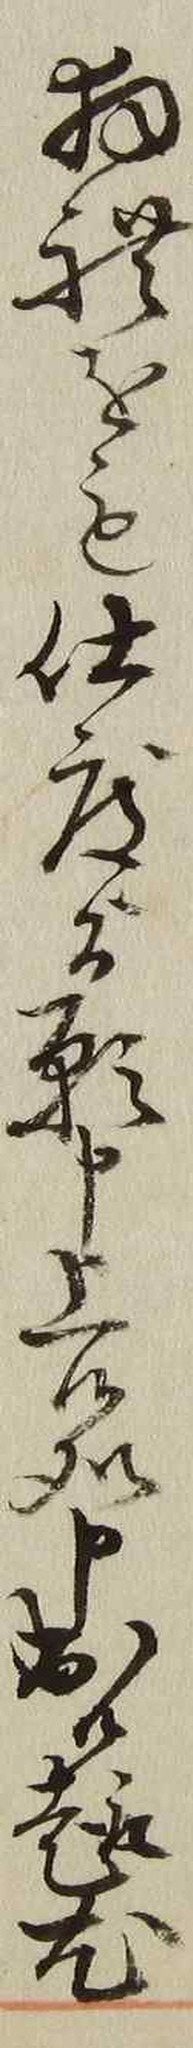拝礼をも仕度旨願申上候処申出候趣尤
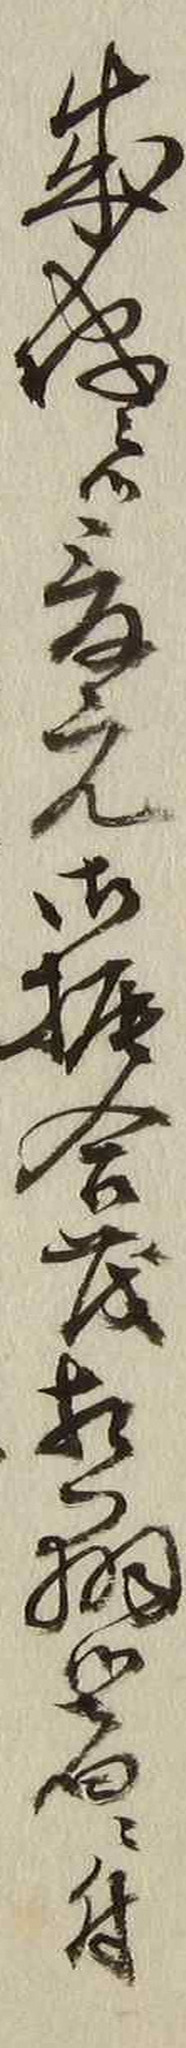成儀ニ候爰元御振合茂相弁候者ニ付
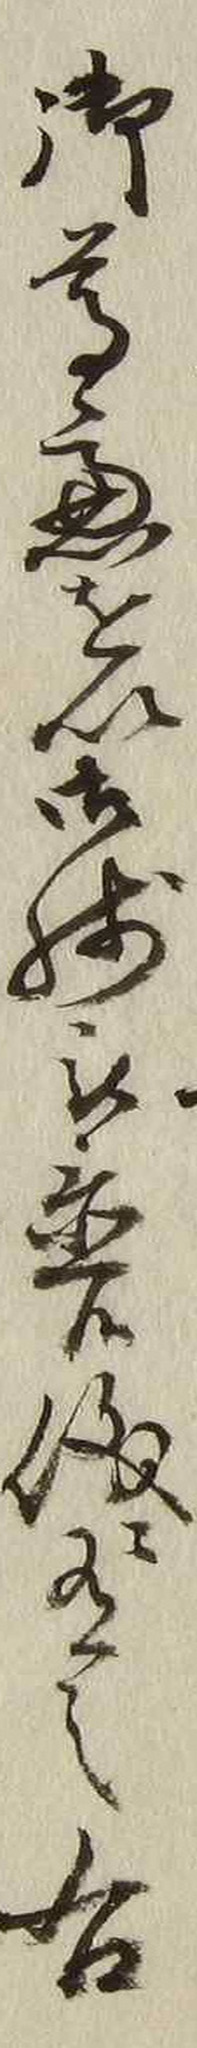御尊慮を以御残被置候儀ニ有之右
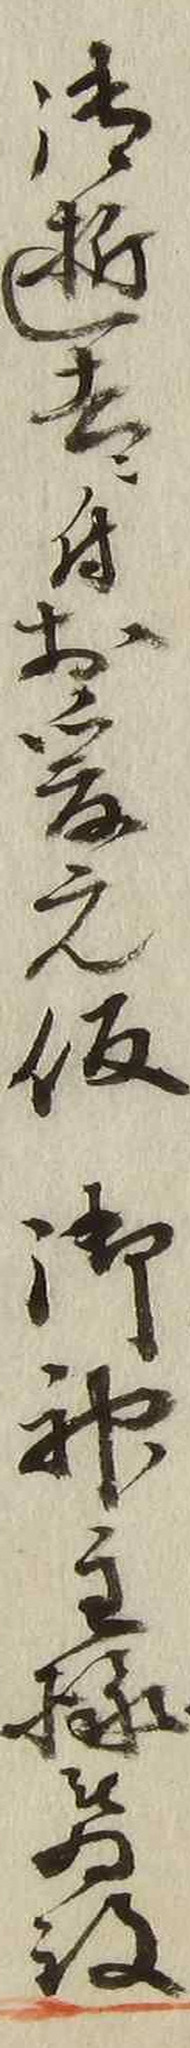御逝去ニ付於爰元仮御神主様被為役
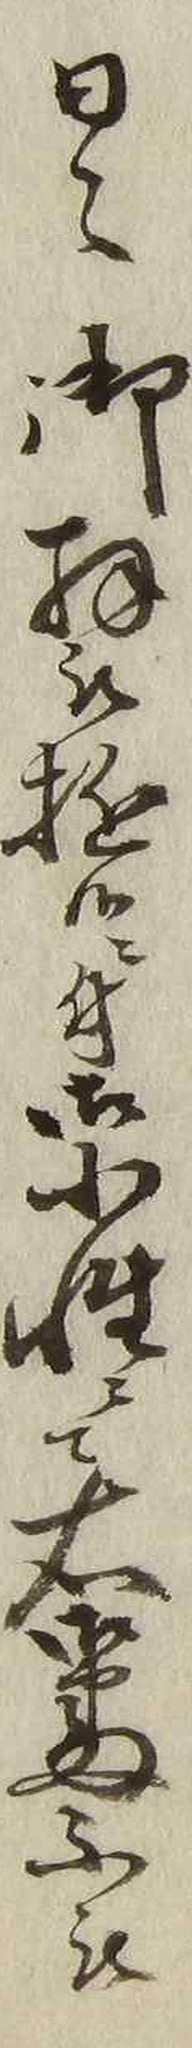日々御拝被遊候ニ付御小性ニて右御番不被
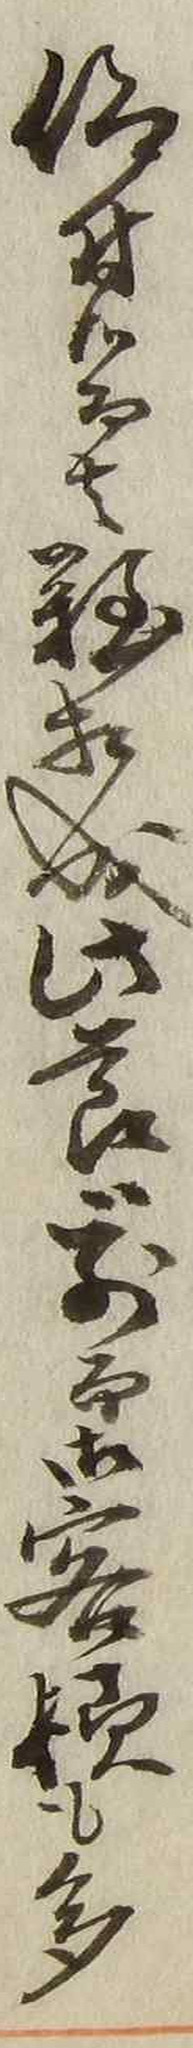仰付候而者難相成此節ハ別而御客様も多
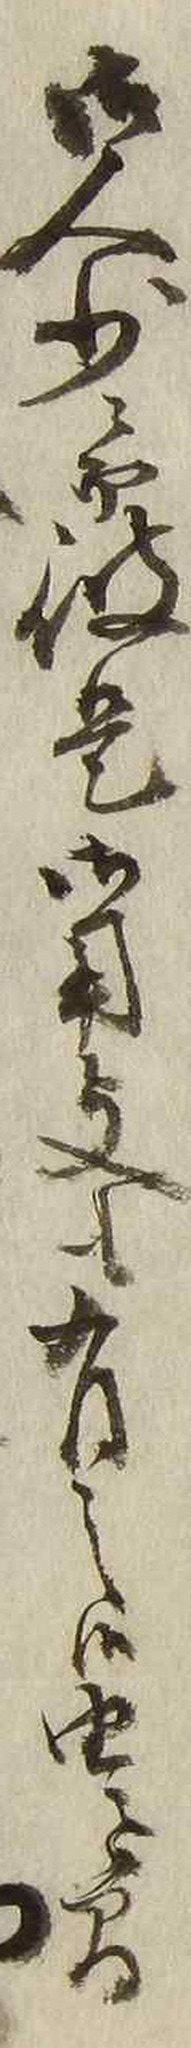御人少ニ而彼是御用支も有之候由ニ候間
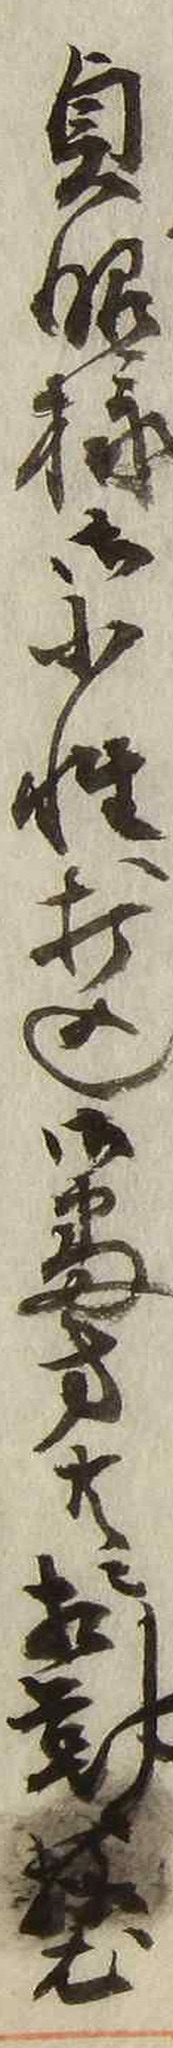貞昭様御小性へ打込御番方共ニ相勤候様尤
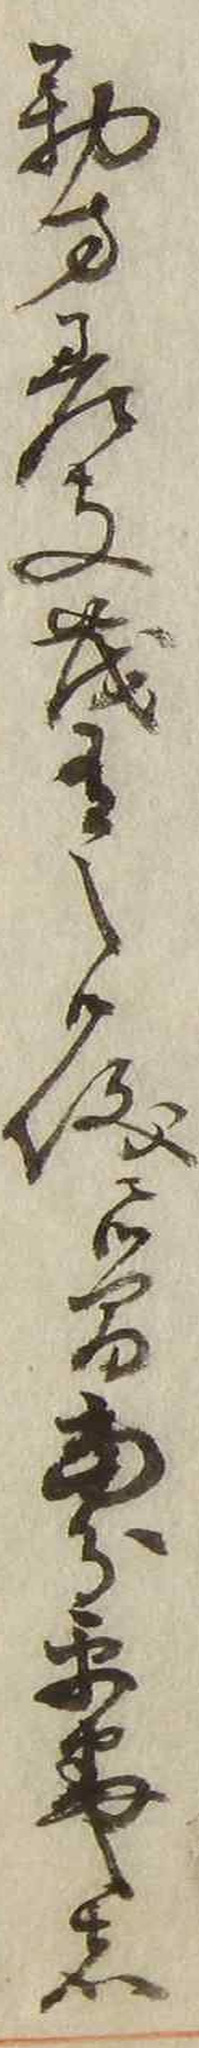勤方差支茂有之候儀ニ候間当分平番之者

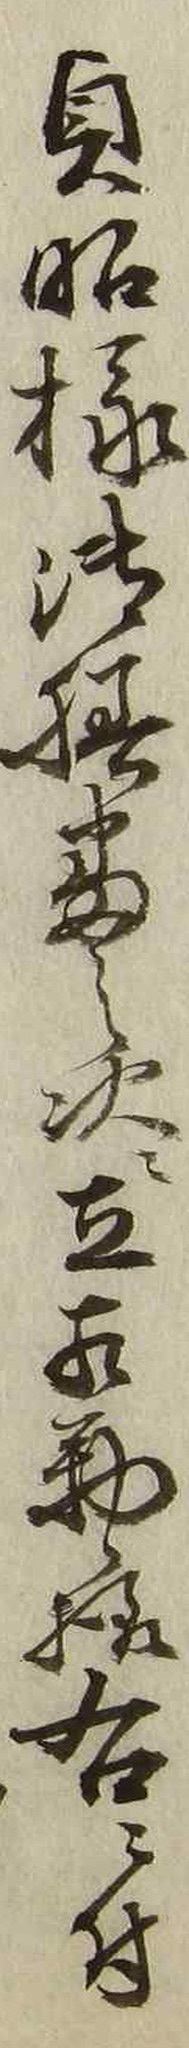貞昭様御膳番之次ニ立相勤候様右ニ付
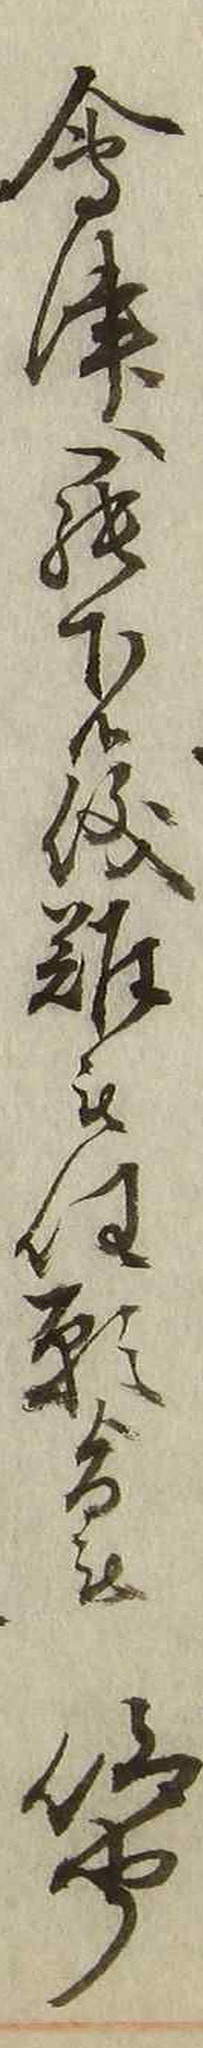会津へ罷下候儀難被任願旨被仰聞
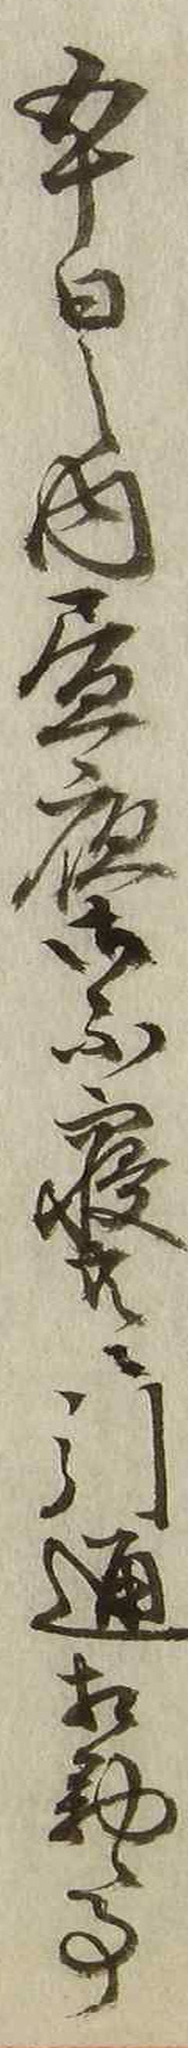五十日之内昼夜御不寝共ニ引通相勤候事
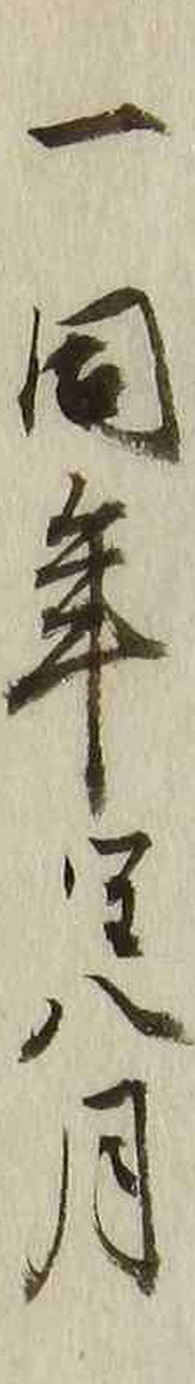一同年閏八月
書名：諸士系譜　巻之23　い之部23
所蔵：会津若松市立会津図書館
